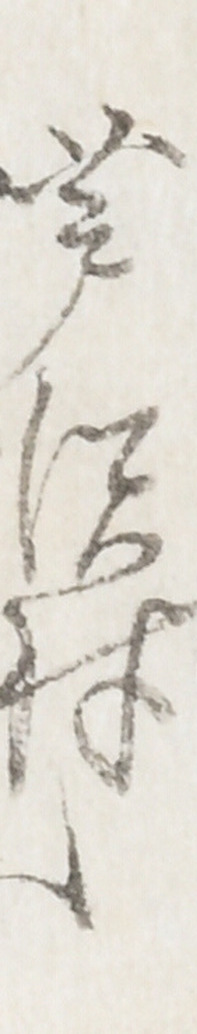芦沢村
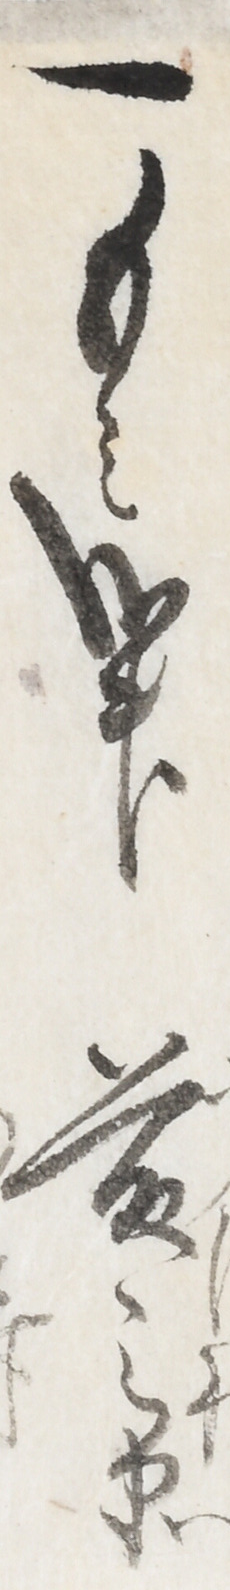一もみ弐升藤兵衛
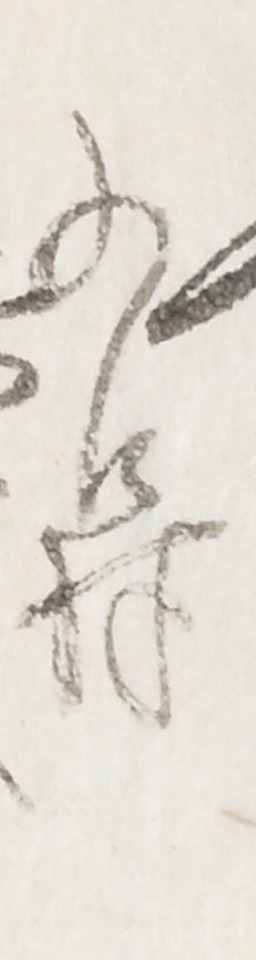の口村
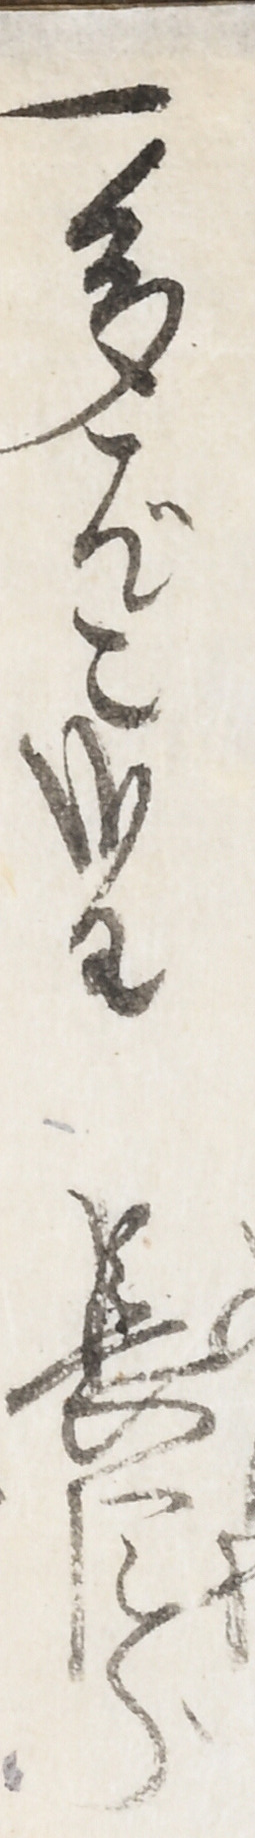一たばこ弐わ長四郎
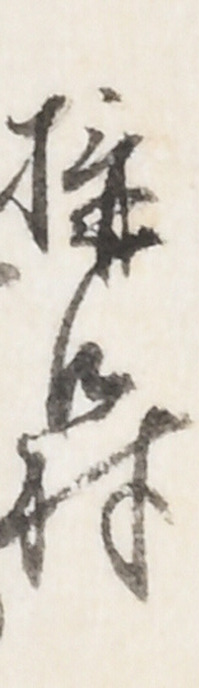野口村
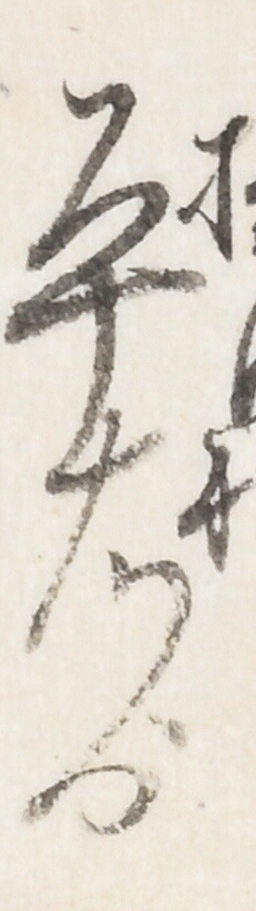十右衛門
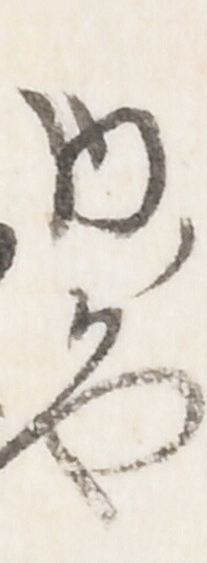内ノかや
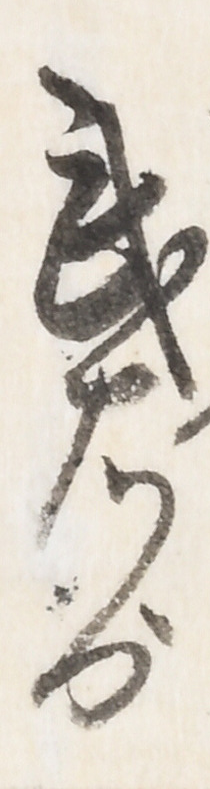十右衛門
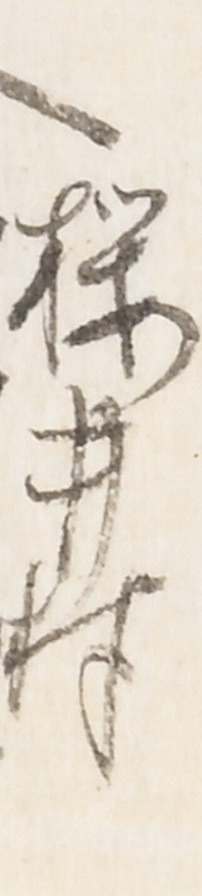桜井村
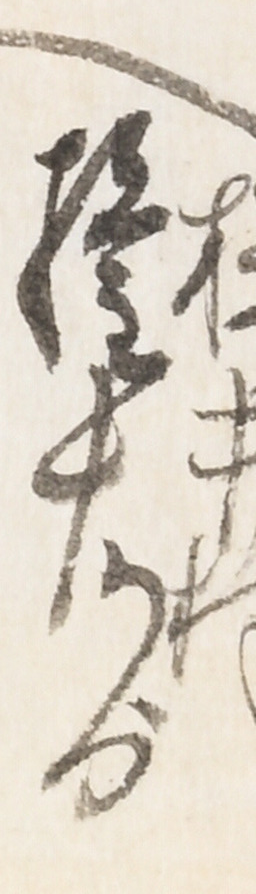十右衛門
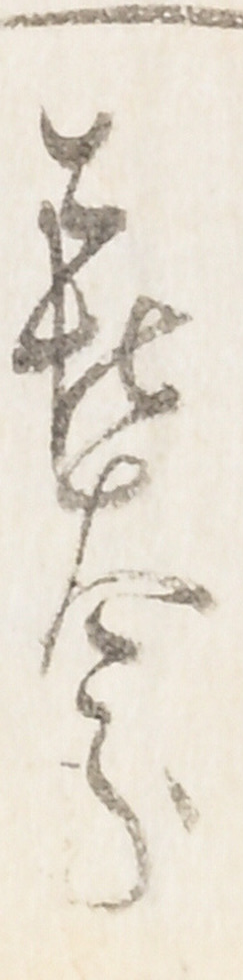喜太郎
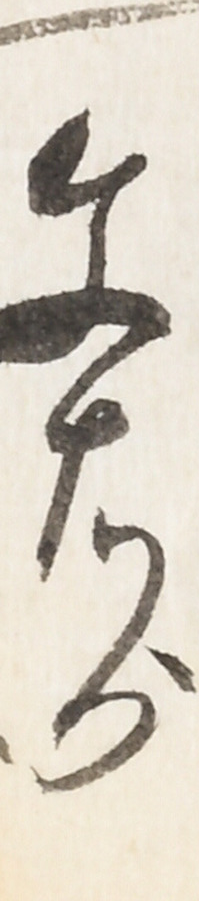十右衛門
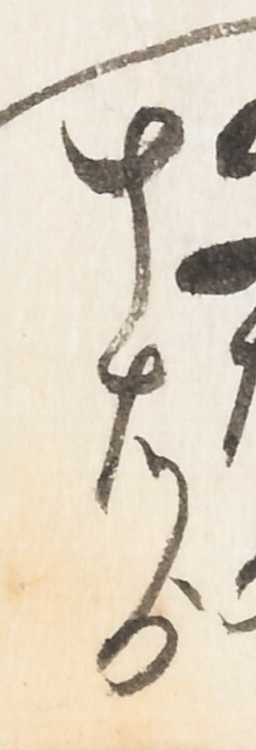十右衛門
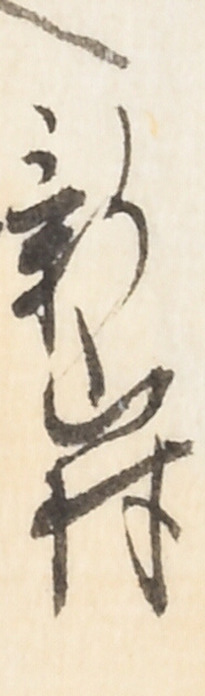新山村
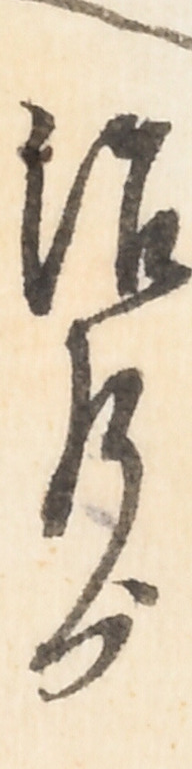治左衛門
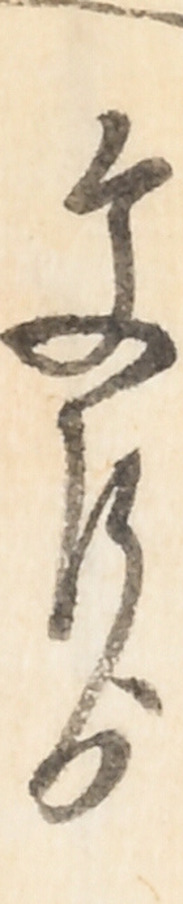文左衛門
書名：合力覚帳
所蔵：伊那市立高遠町図書館・合同会社AMANE
